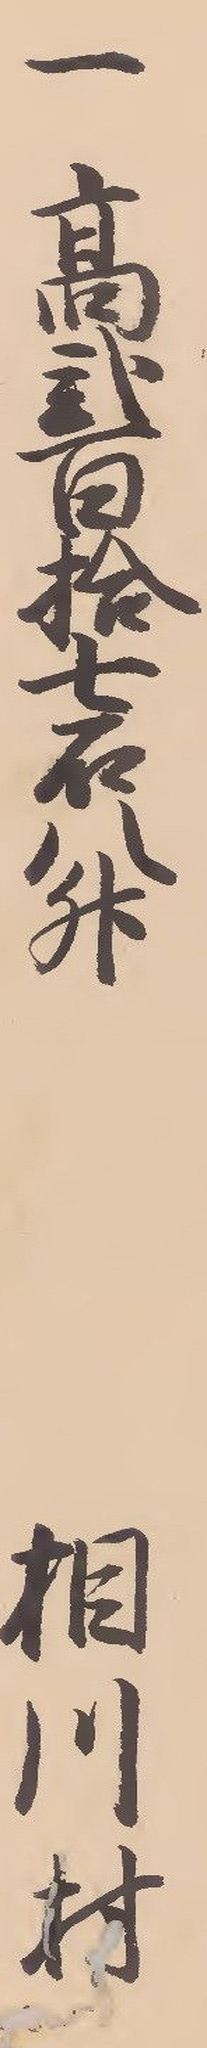一高弐百拾七石八升相川村
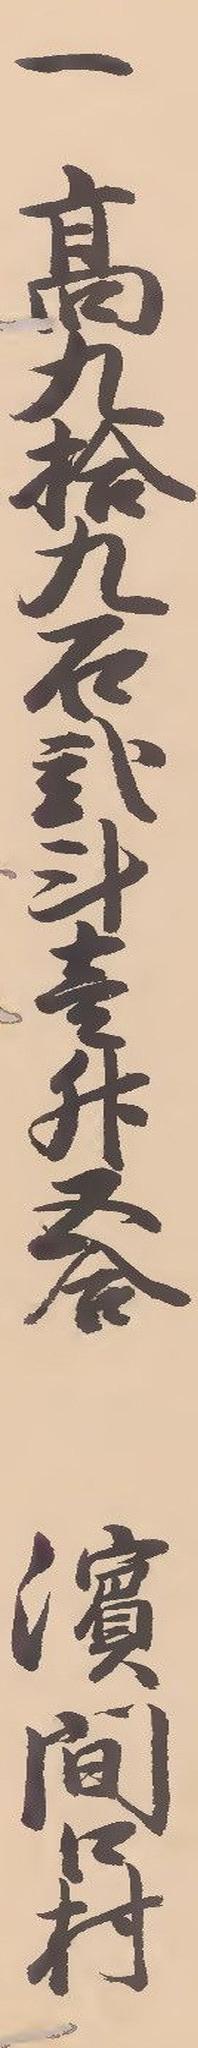一高九拾九石弐斗壱升五合浜間口村

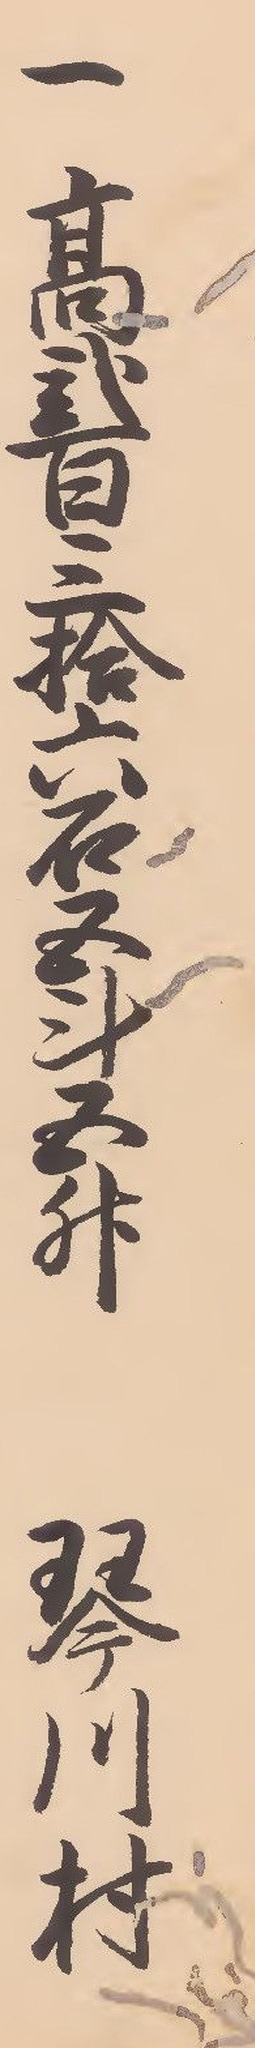一高弐百三拾六石五斗五升琴川村
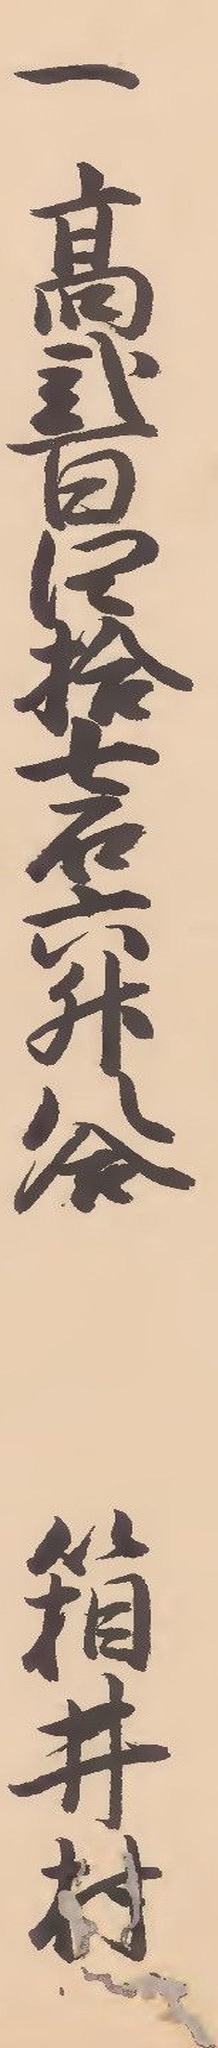一高弐百四拾七石六升八合箱井村
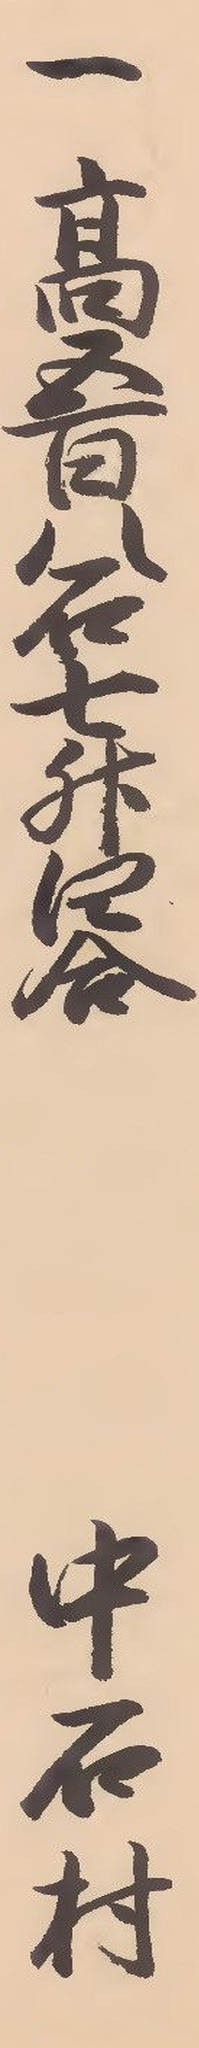一高五百八石七升四合中石村
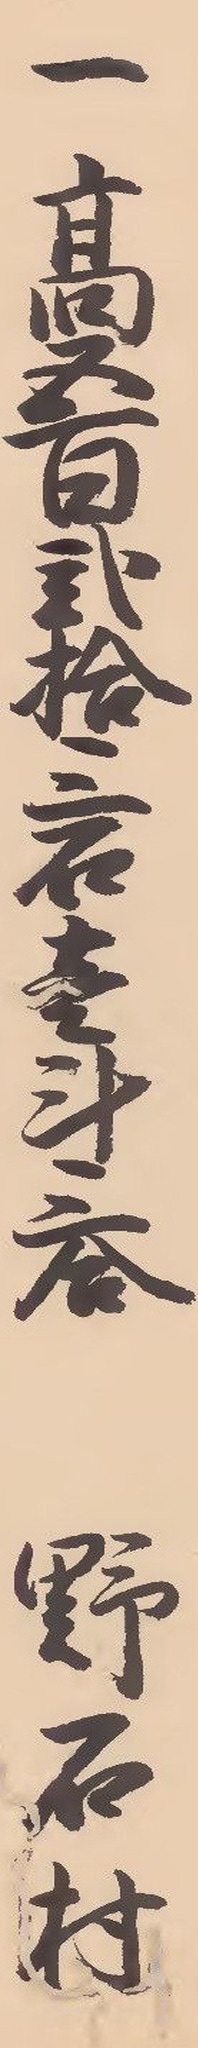一高五百弐拾三石壱斗三合野石村
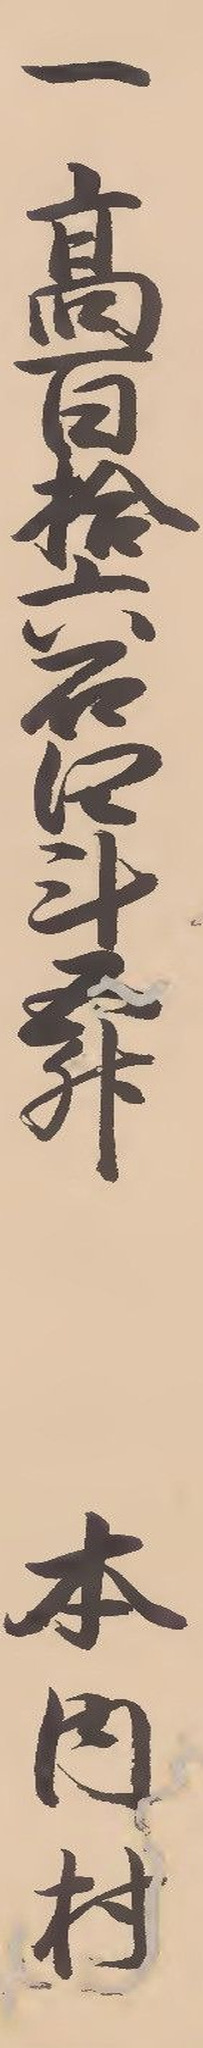一高五百六石四斗五升本内村
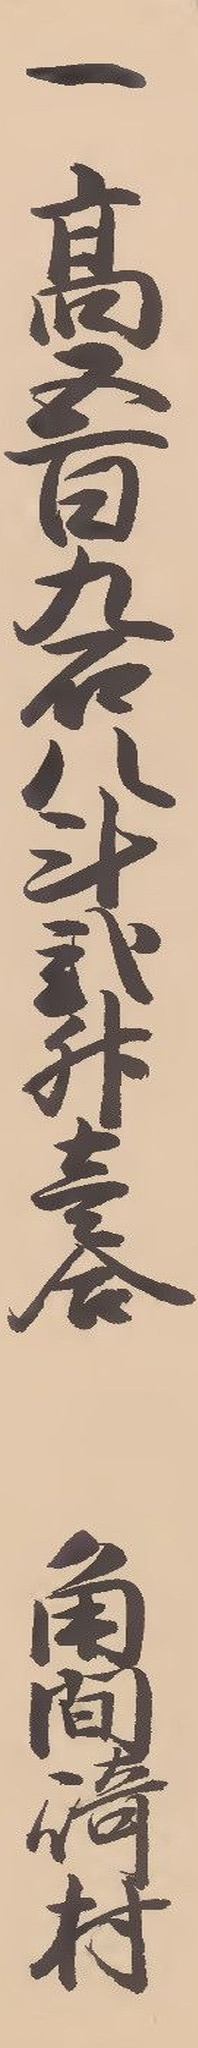一高五百九石八斗弐升壱合角間崎村
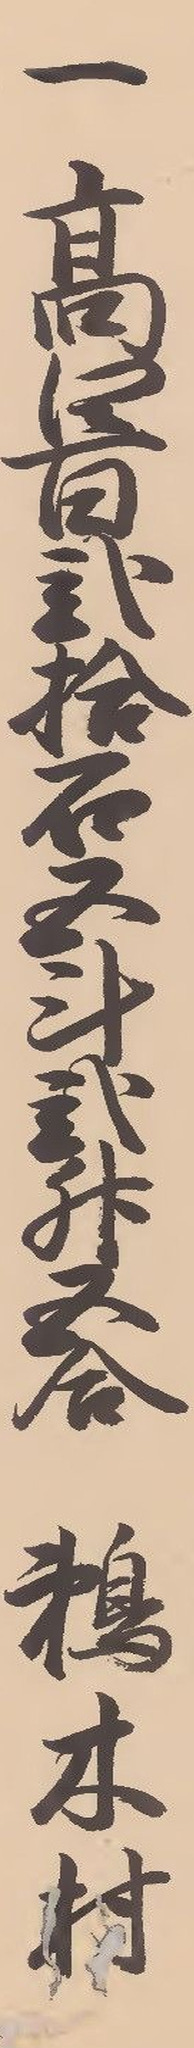一高四百弐拾石五斗弐升五合鵜木村
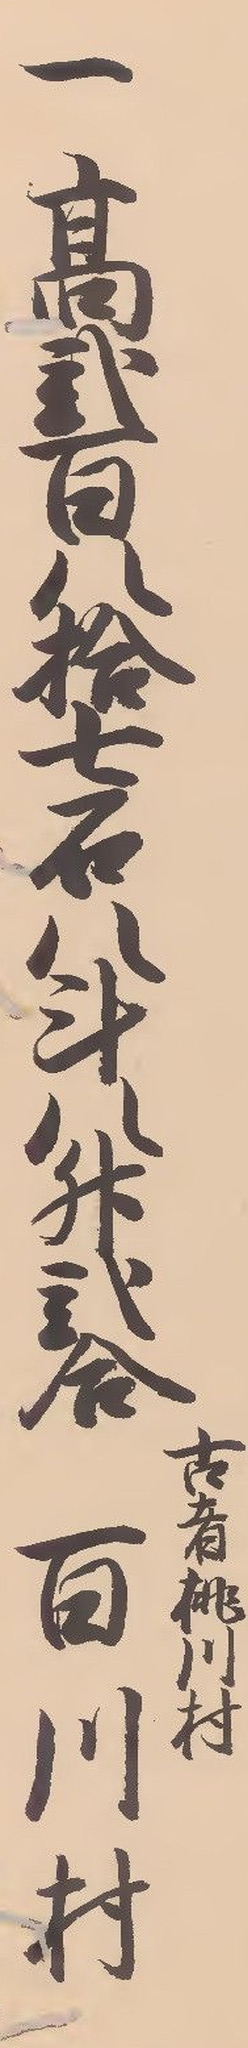一高弐百八拾七石八斗八升弐合百川村

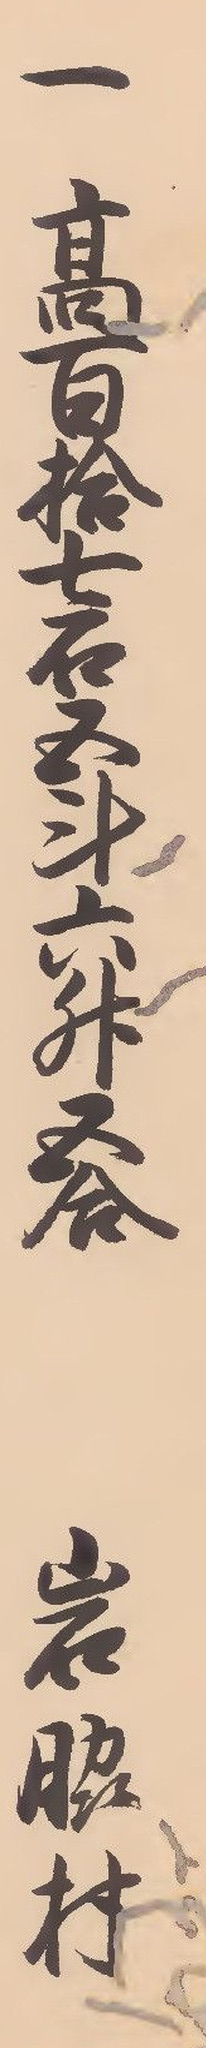一高百拾七石五斗六升五合岩脇村
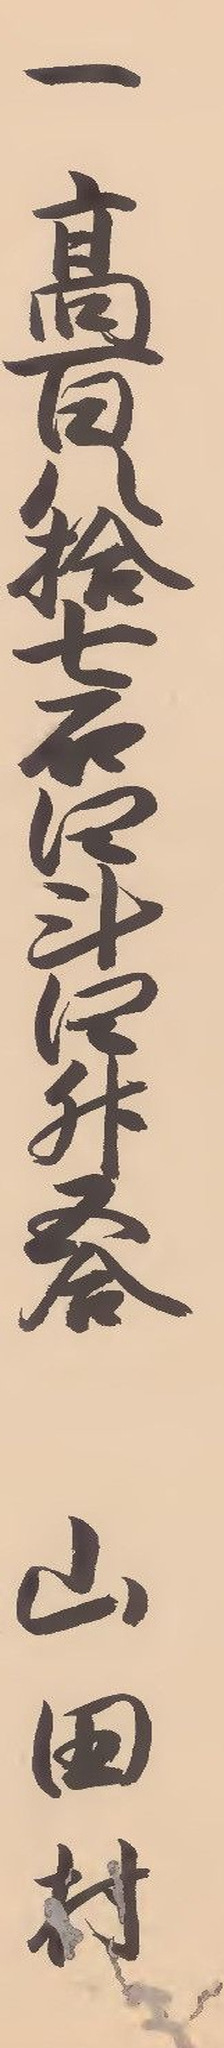一高百八拾七石四斗四升五合山田村
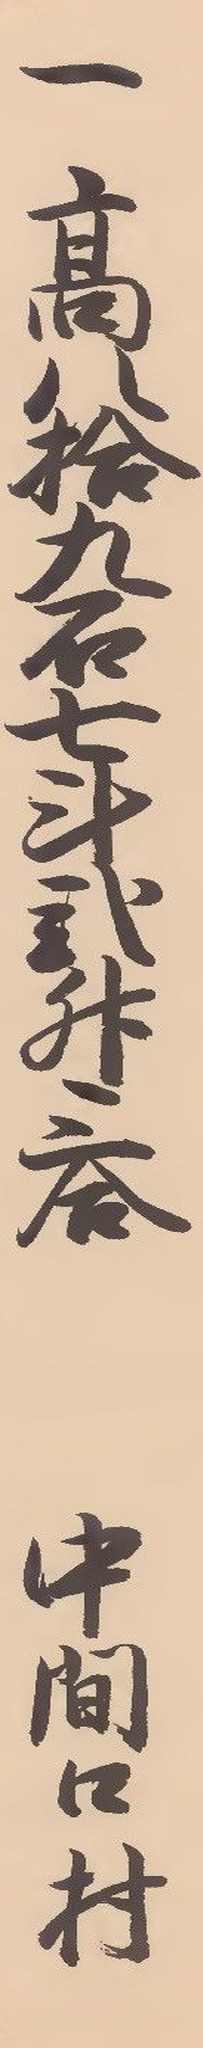一高八拾九石七斗弐升三合中間口村
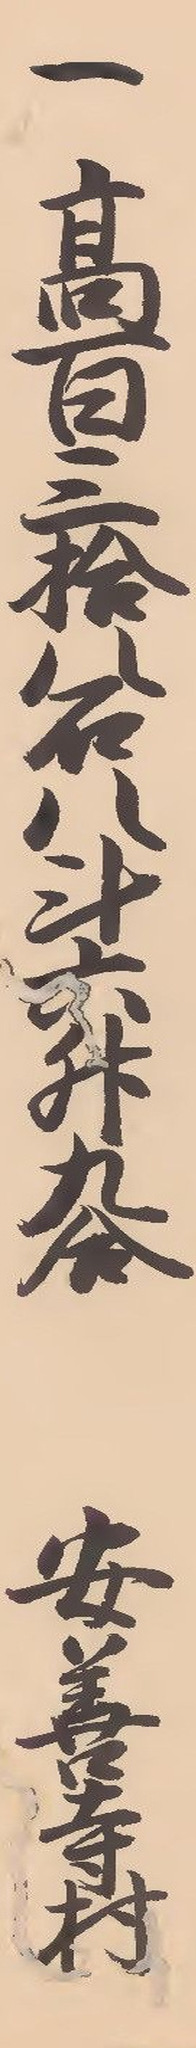一高百三拾八石八斗六升九合安善寺村
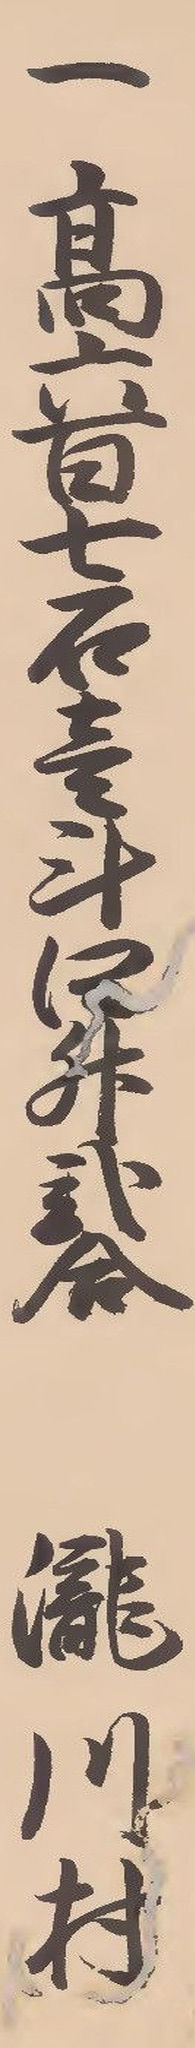一高六百七石壱斗四升弐合滝川村
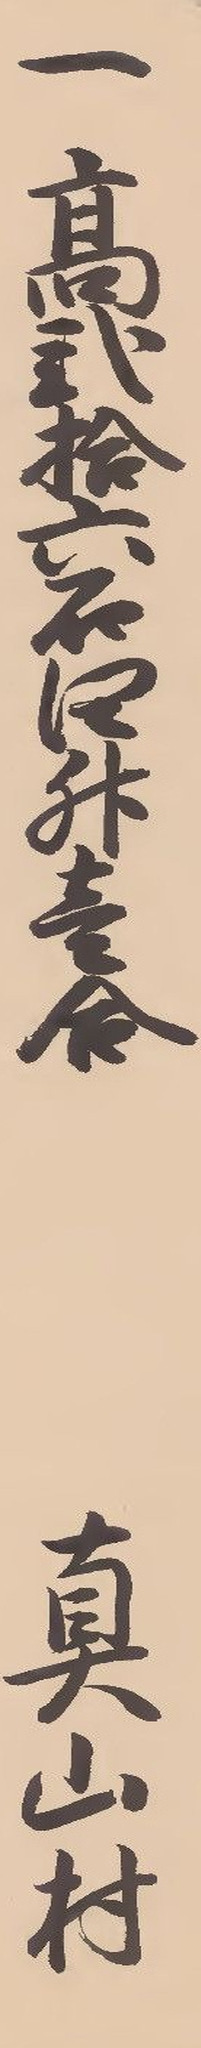一高弐拾六石四升壱合真山村
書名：出羽国郷帳　５
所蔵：国立公文書館 National Archives of Japan
